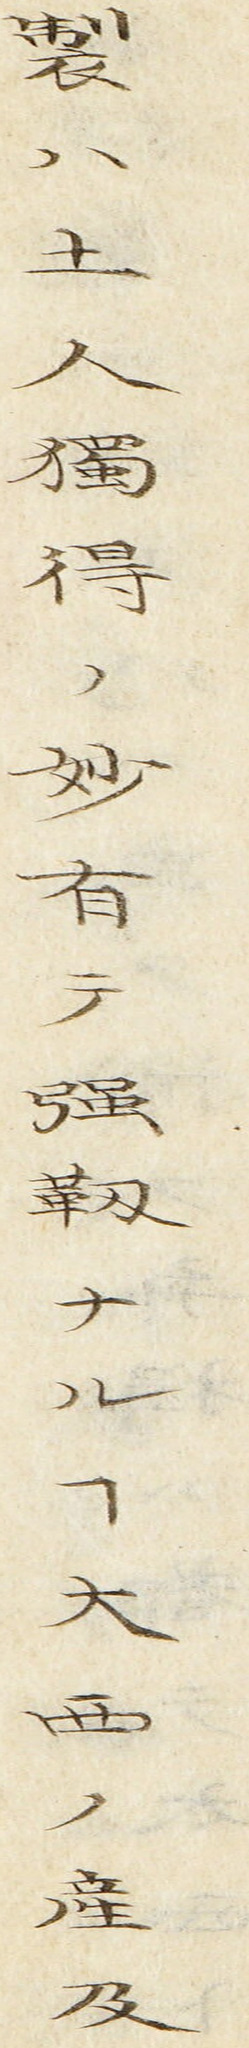製ハ土人獨得ノ妙有テ強靭ナルコト大西ノ産及
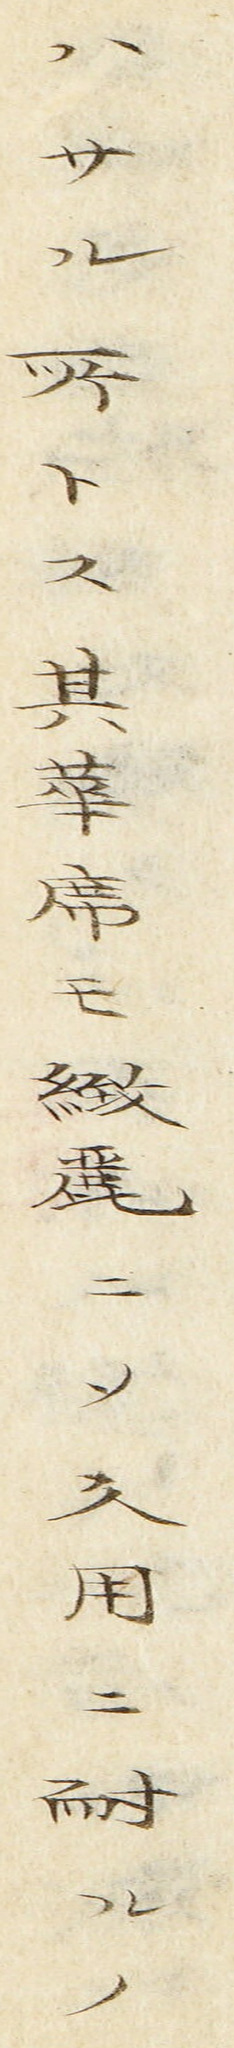ハサル所トス其華席モ緻麗ニシテ久用ニ耐ルノ

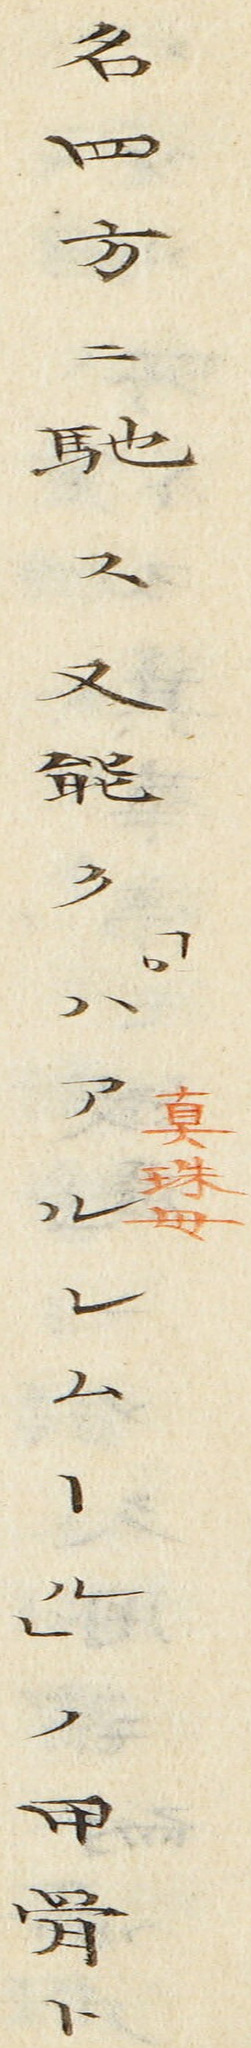名四方ニ馳ス又能ク「パアルレムール」ノ甲骨ト
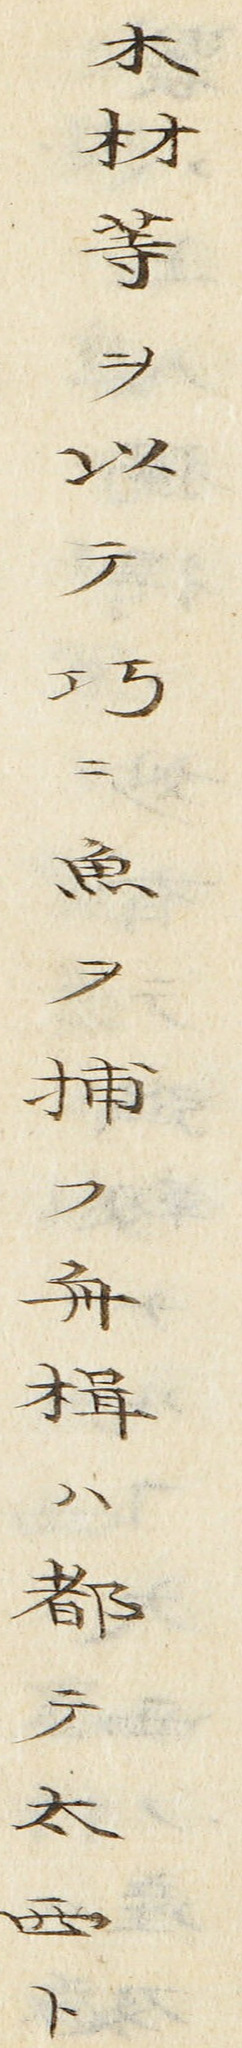木材等ヲ以テ巧ニ魚ヲ捕フ舟楫ハ都テ太西ト
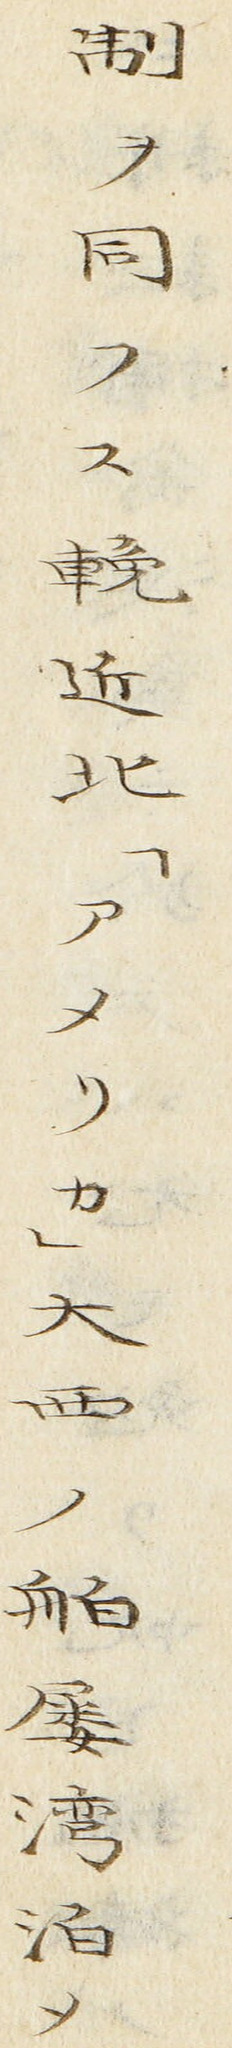制ヲ同クス輓近北「アメリカ」大西ノ舶屡湾泊シテ
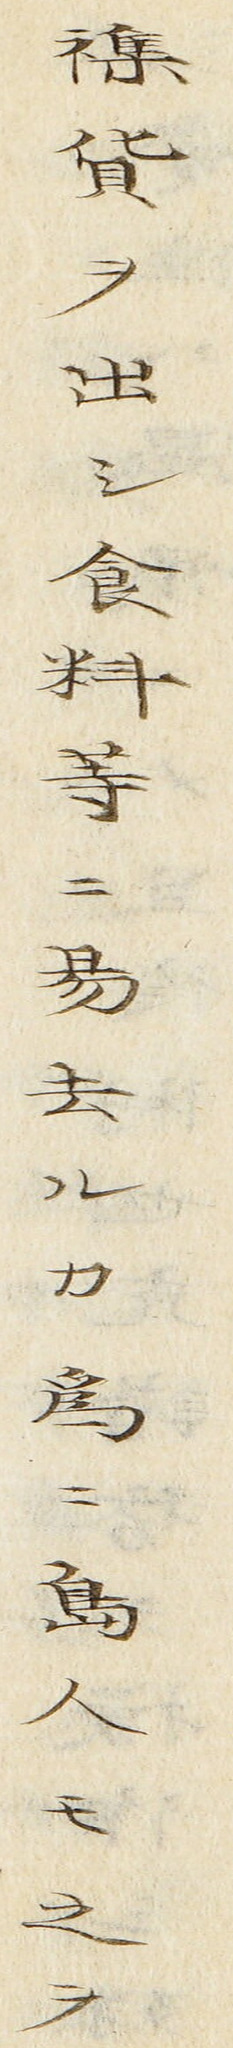襍貨ヲ出シ食料等ニ易去ルカ為ニ島人モ之ヲ
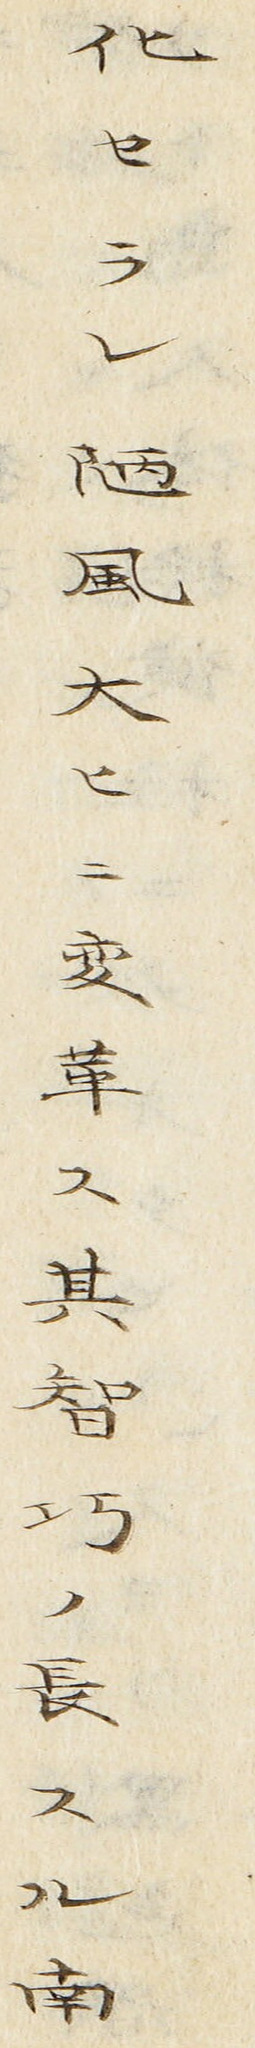化セラレ陋風大ヒニ変革ス其智功ノ長スル南
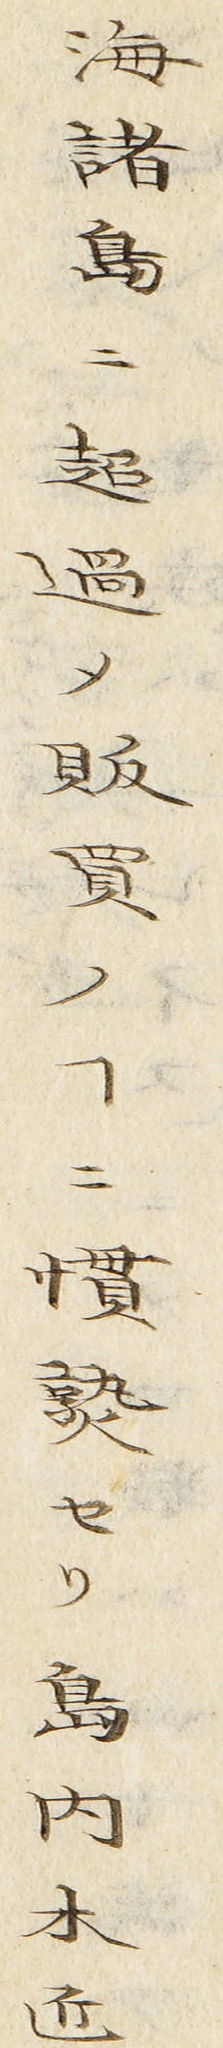海諸島ニ超過シテ販買ノコトニ慣熟セリ島内木匠？
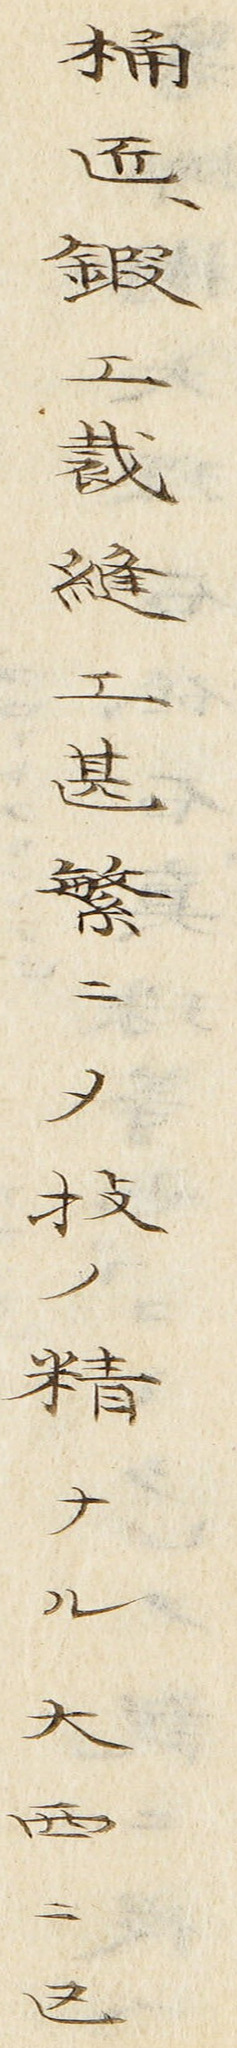桶匠、鍛工裁縫工甚繁ニシテ技ノ精ナル大西ニ区？
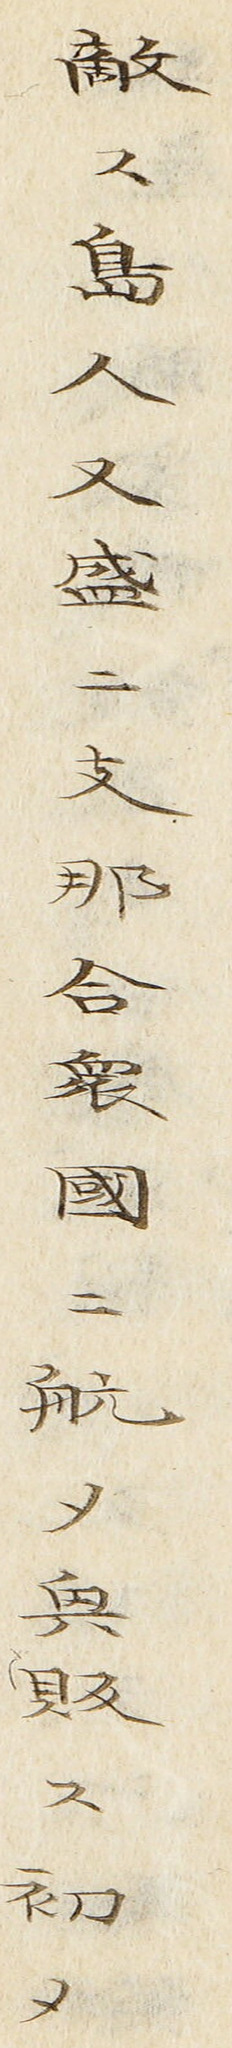敵ス島人又盛ニ支那合衆國ニ航シテ興販ス初メ
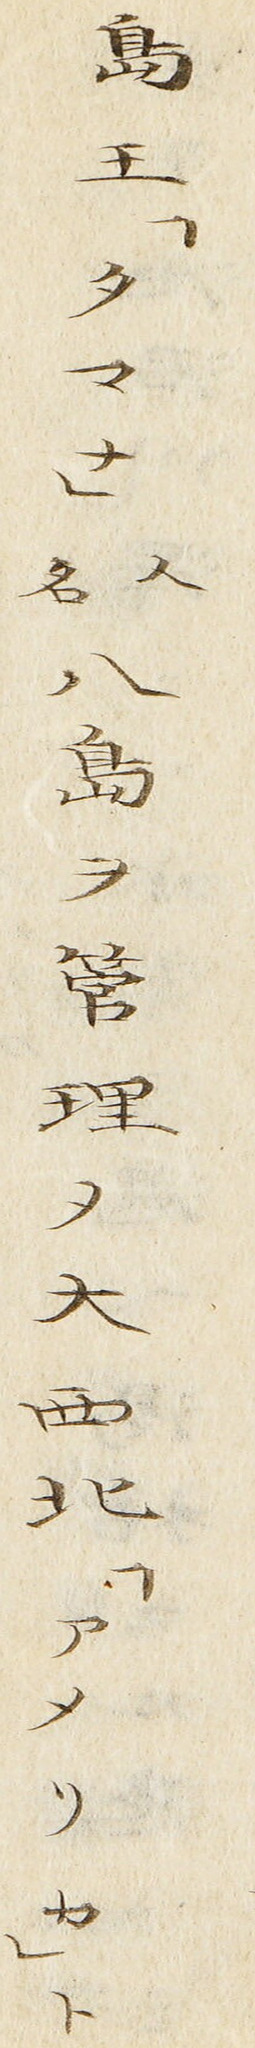島王「タマナ」人名八島ヲ管理シテ大西北「アメリカ」ト
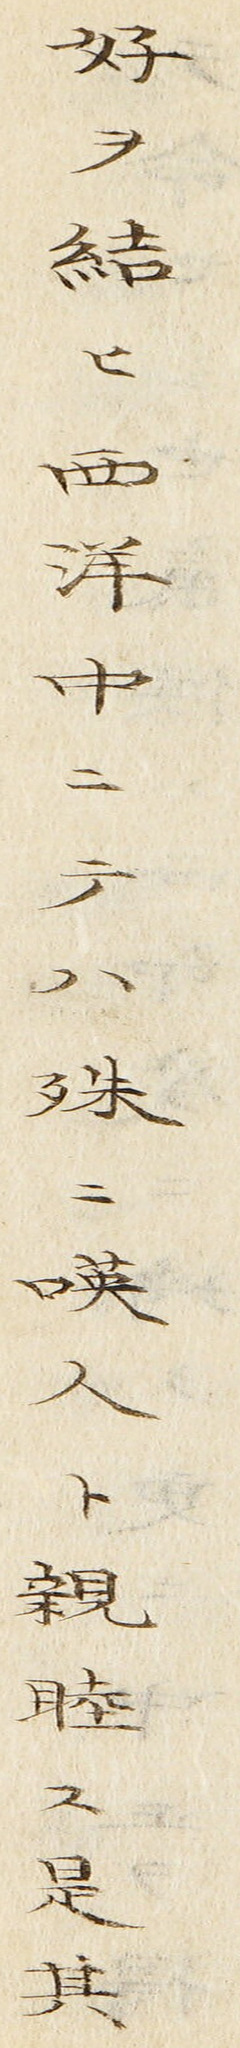好ヲ結ヒ西洋中ニテハ殊ニ人ト親睦ス是其
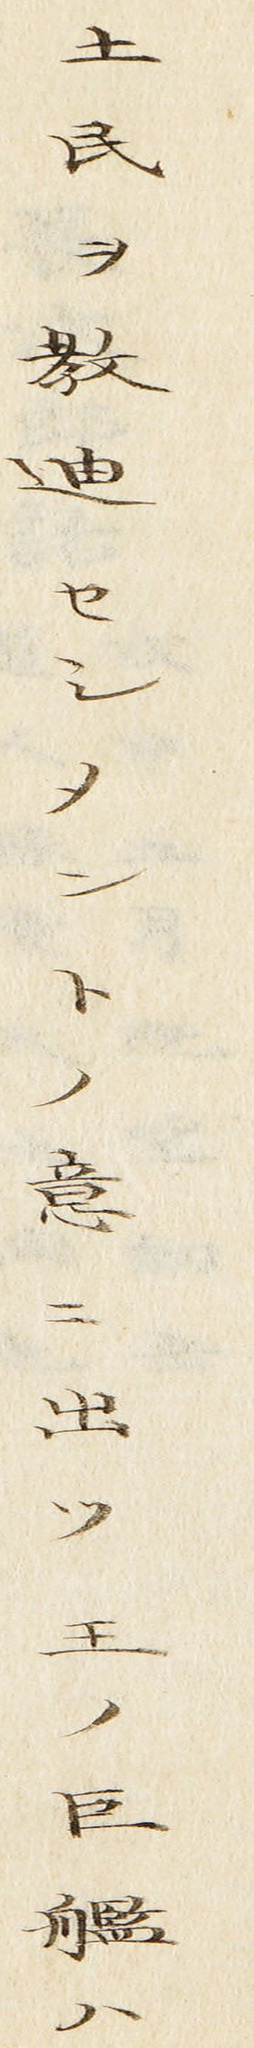土民ヲ教迪セシメントノ意ニ出ツ王ノ巨艦ハ
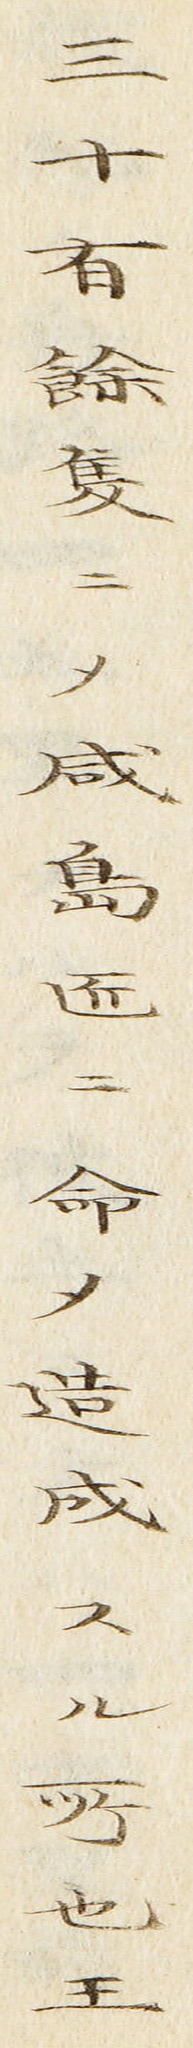三十有餘隻ニシテ咸島匠ニ命シテ造成スル所也王
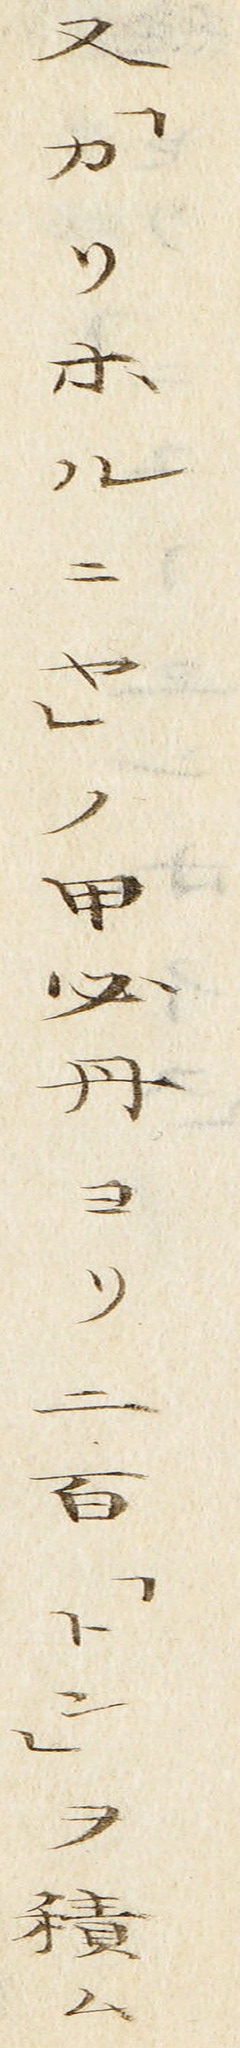又「カリホルニヤ」ノ甲必丹ヨリ二百「トン」ヲ積ム
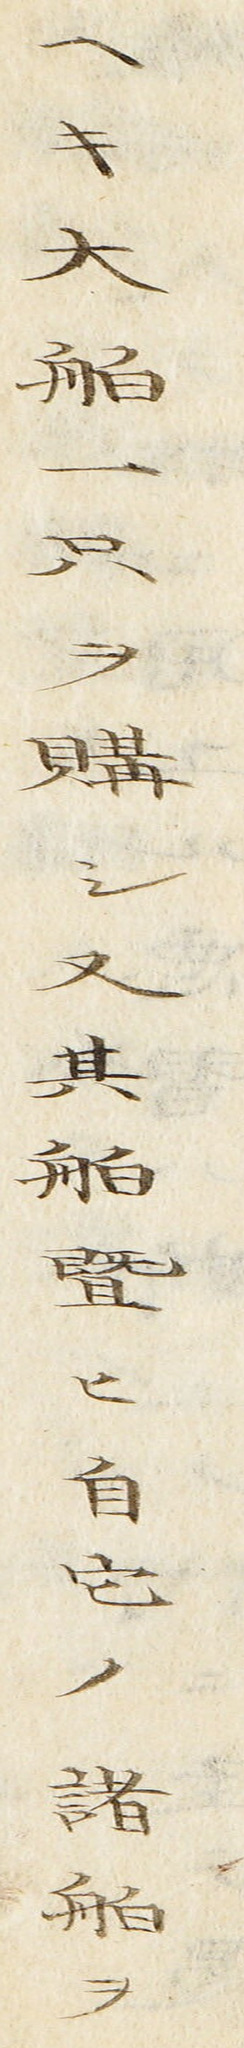ヘキ大舶一只ヲ購シ又其舶曁ヒ自它ノ諸舶ヲ
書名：蕃談
